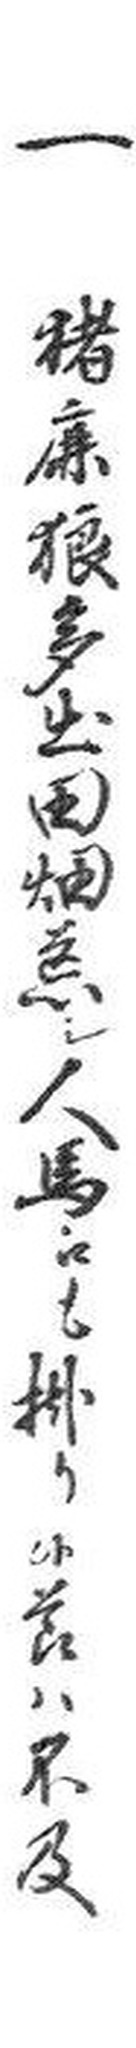一猪鹿狼多出田畑荒シ人馬江も掛り候節ハ不及
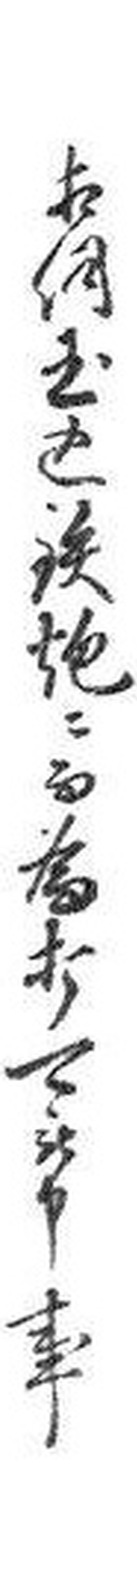相伺玉込鉄炮ニ而為打可被申事
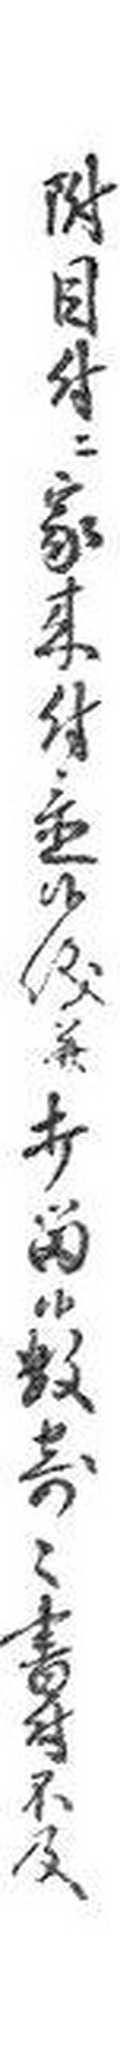附目付ニ家来付置候儀幷打留候数寄々書付不及
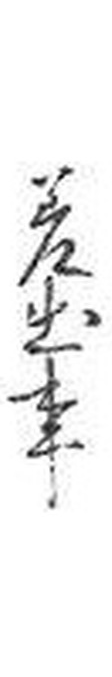差出事
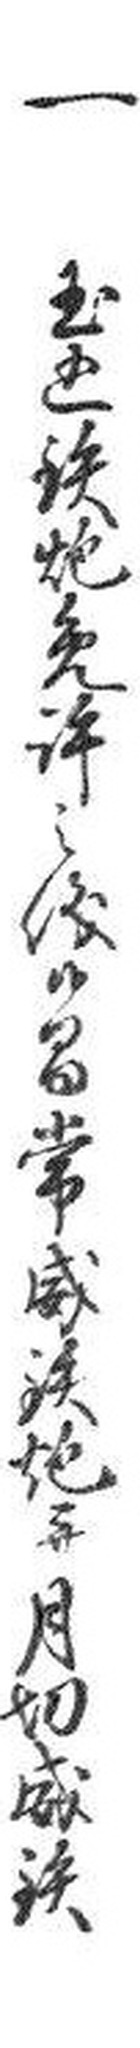一玉込鉄炮免許之儀候間常威鉄炮幷月切威鉄
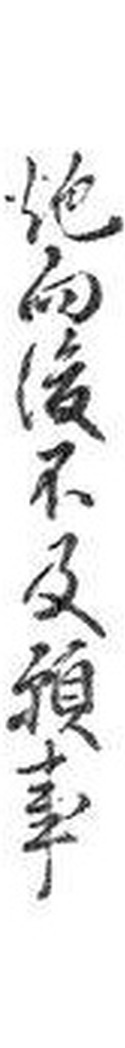炮向後不及願事
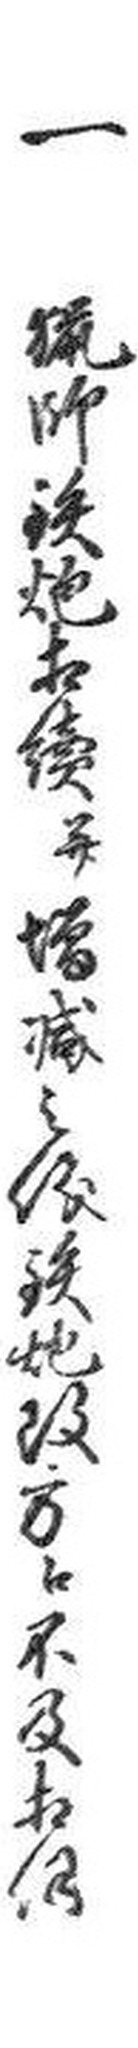一猟師鉄炮相続幷増減之儀鉄炮改方江不及相伺
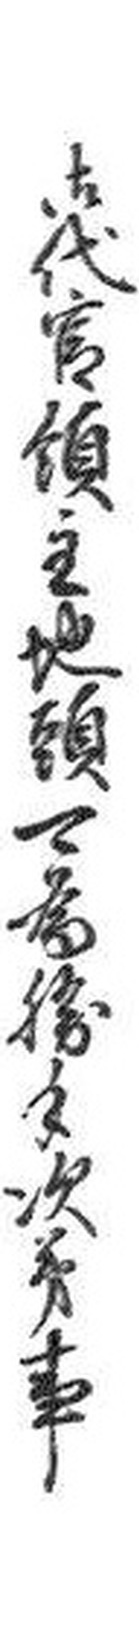御代官領主地頭可為勝手次第事
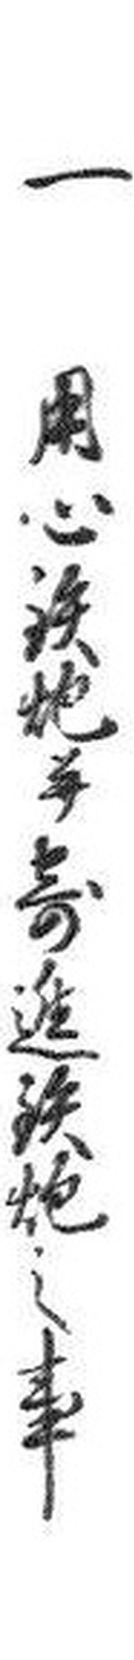一用心鉄炮幷寄進鉄炮之事
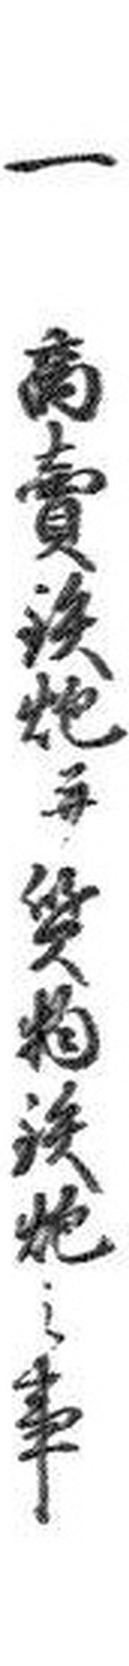一商売鉄炮幷質物鉄炮之事
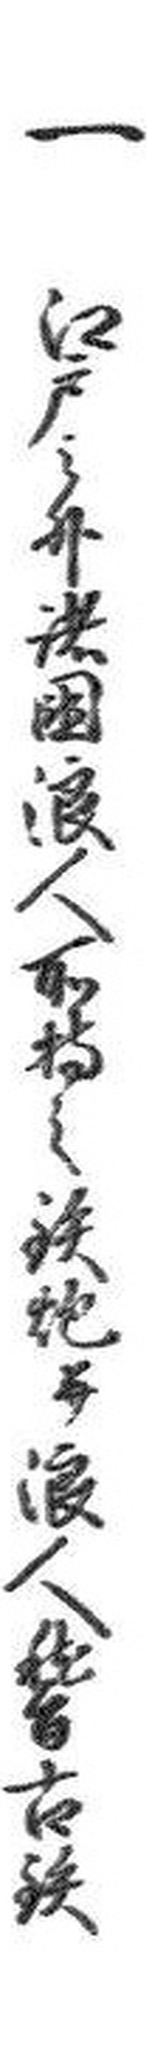一江戸之外諸国浪人所持之鉄炮幷浪人稽古鉄
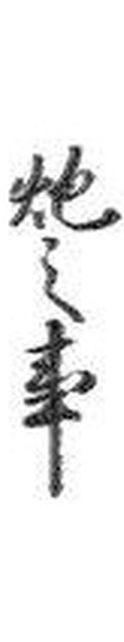炮之事
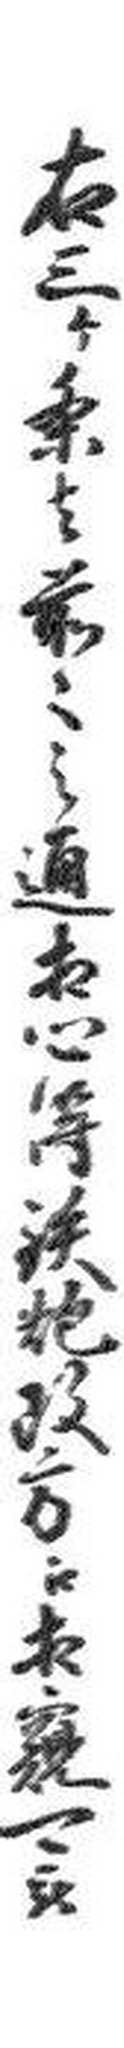右三ヶ条は前々之通相心得鉄炮改方江相窺可被
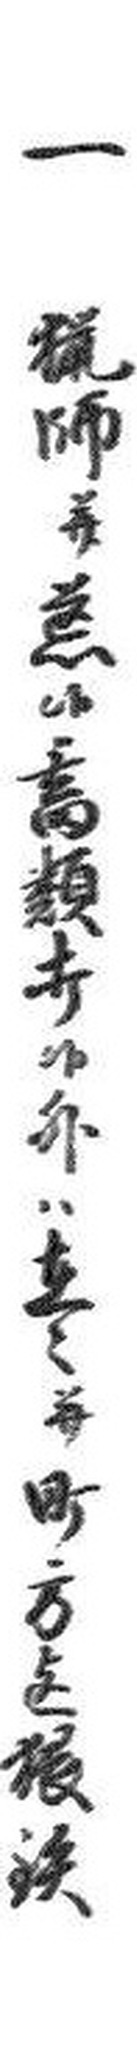一猟師幷荒候畜類打候外は在々幷町方迄猥鉄
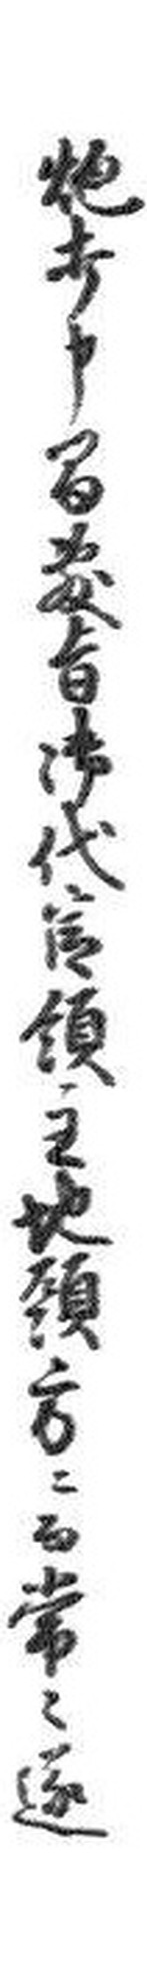炮打申間敷旨御代官領主地頭方ニ而常々遂
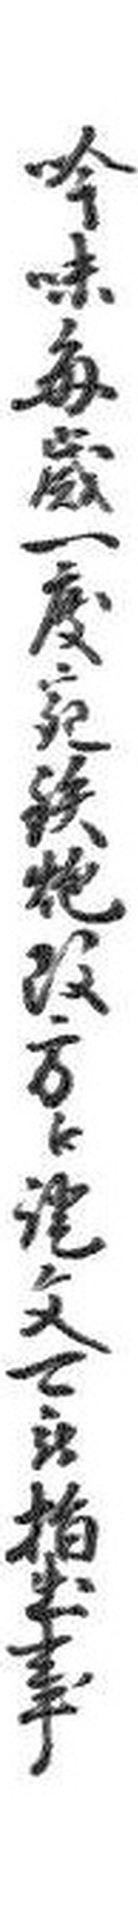吟味毎歳一度宛鉄炮改方江證文可被指出事
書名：家譜 二十五 吉品公 従宝永六年到同七年
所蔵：福井県文書館 Fukui Prefectural Archives
